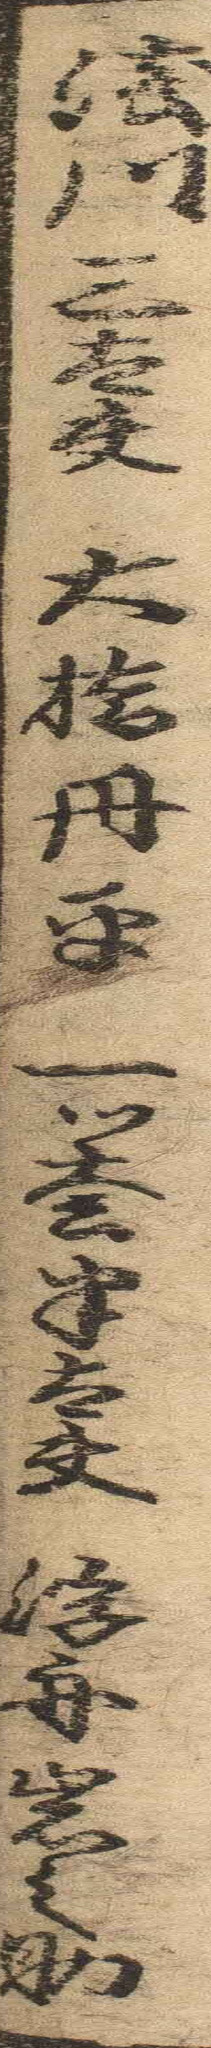浅川三太夫大橋丹平一松半太夫浮舟岩之助
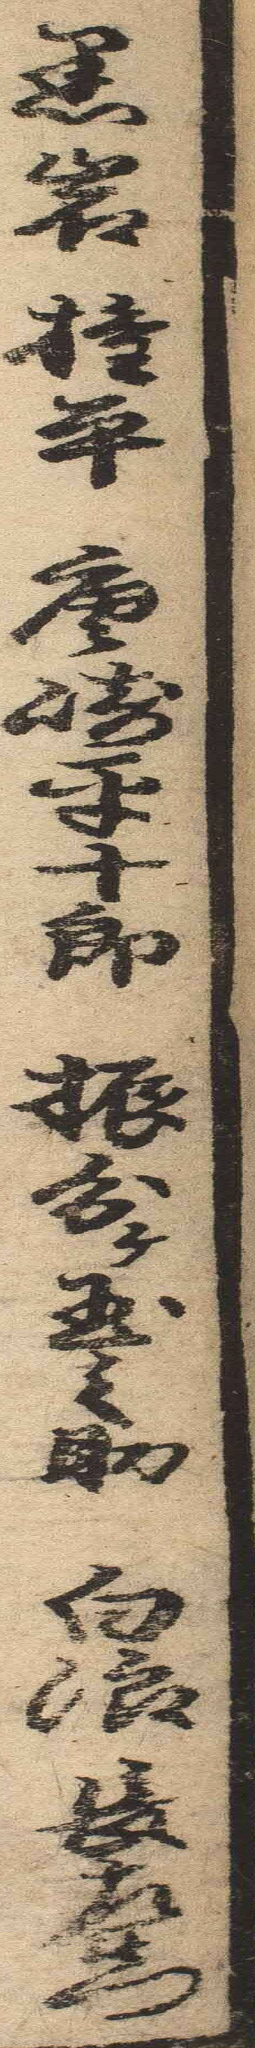黒岩権平唐崎平十郎振分ケ玉之助白波長左衛門
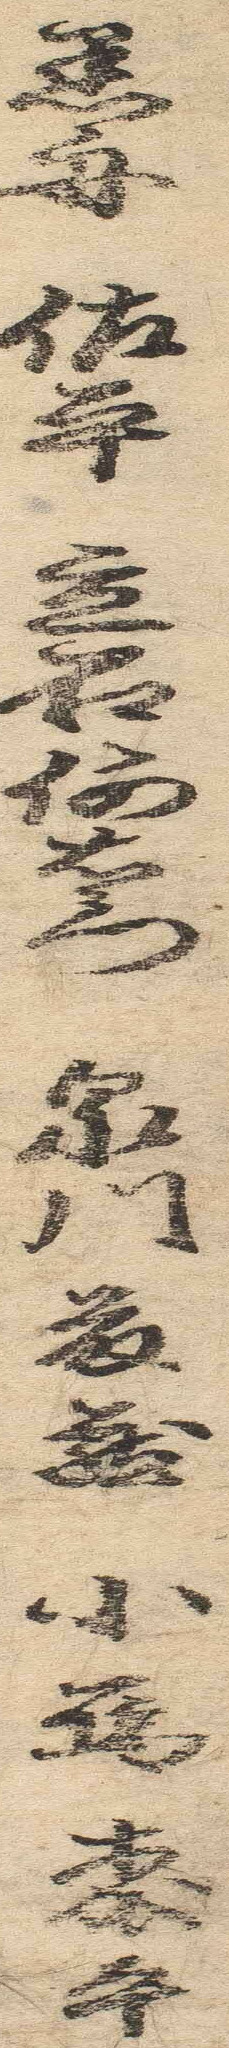黒舟佐平立石何右衛門泉川藤蔵小鴈森平
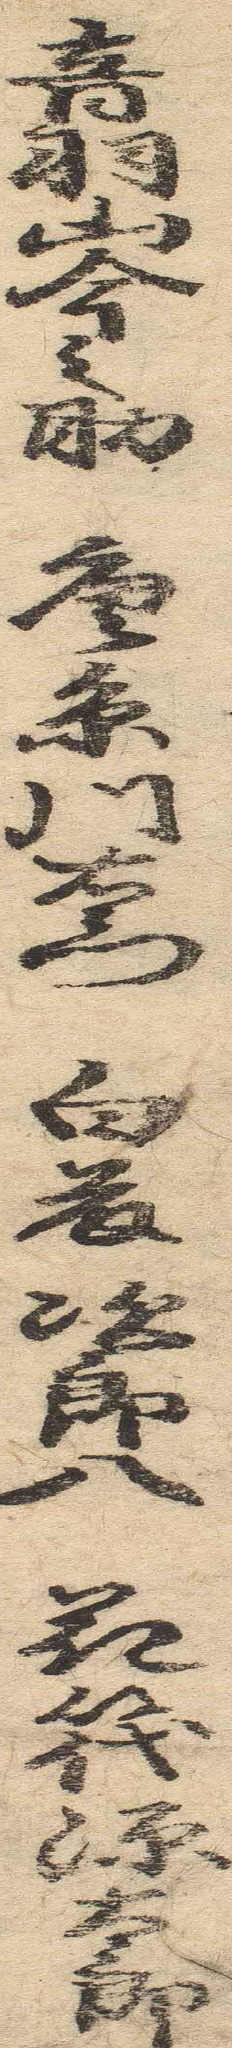音羽山今之助唐糸門右衛門白藤次郎八花筏源太郎
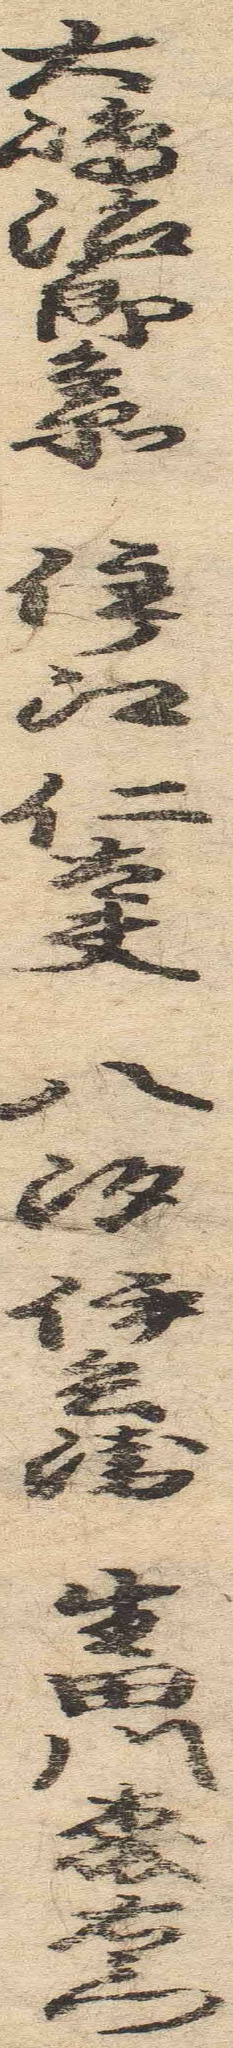大嶋治郎兵衛住ケ江仁太夫八汐伊兵衛生田川森右衛門
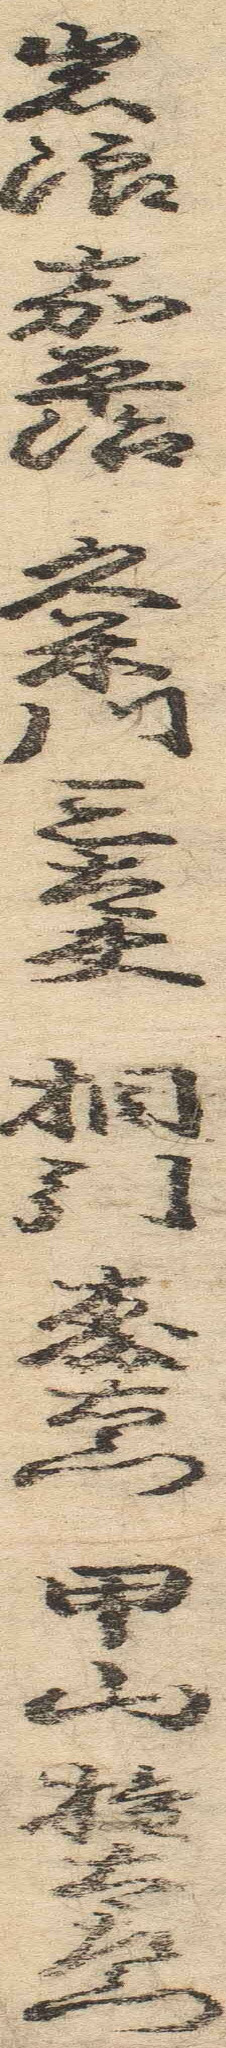岩浪嘉平治久米川三太夫相引森右衛門甲山権太左衛門
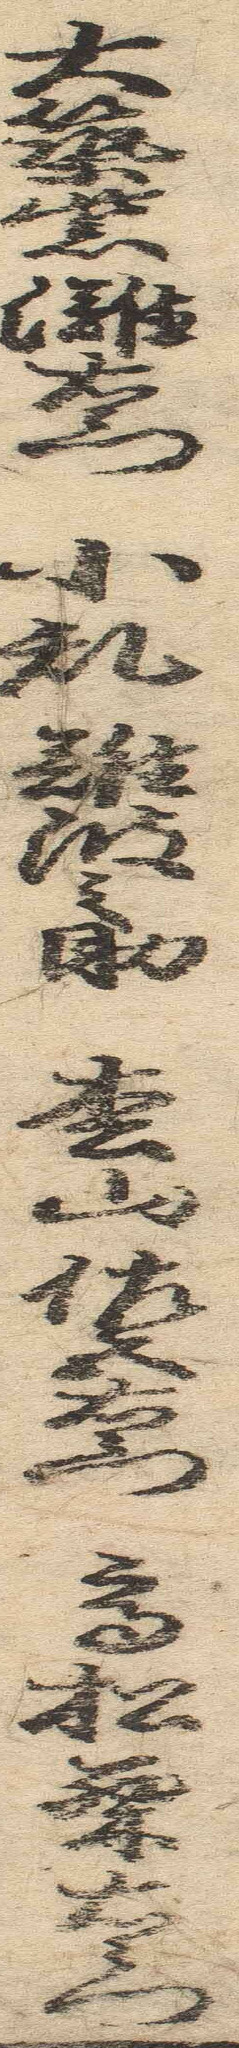大筑紫灘右衛門小乱難波之助松山佐五右衛門高松栗右衛門
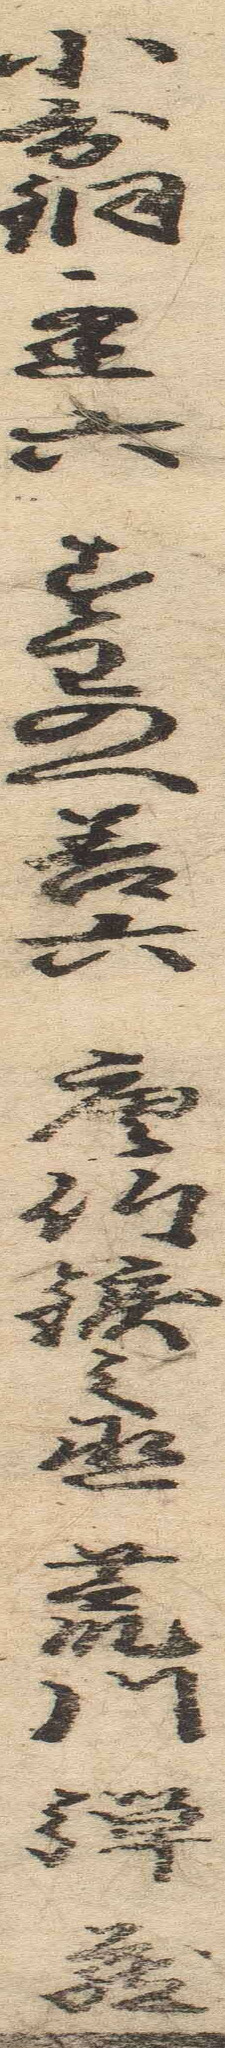小分銅重六すわのへ善六唐竹鉄之丞荒川弾蔵
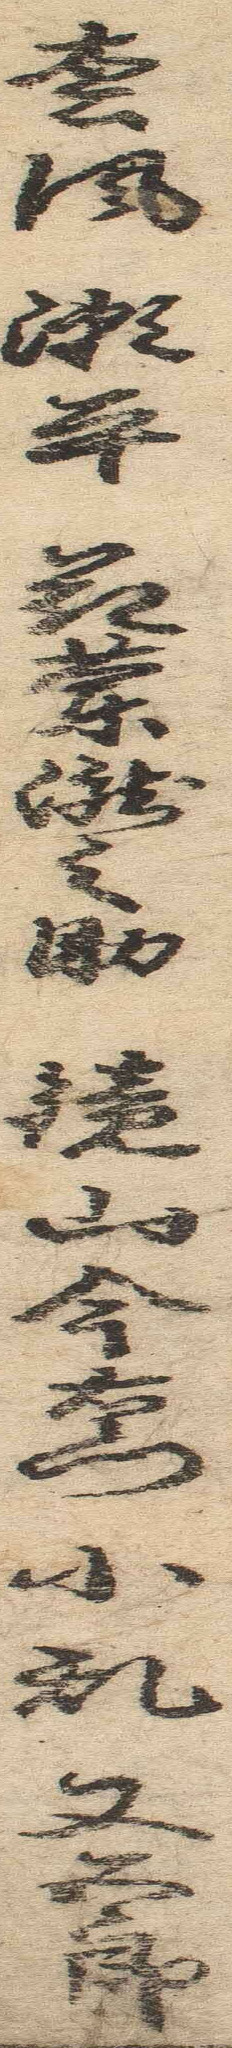松風瀬平花菊瀧之助鏡山今右衛門小乱又五郎
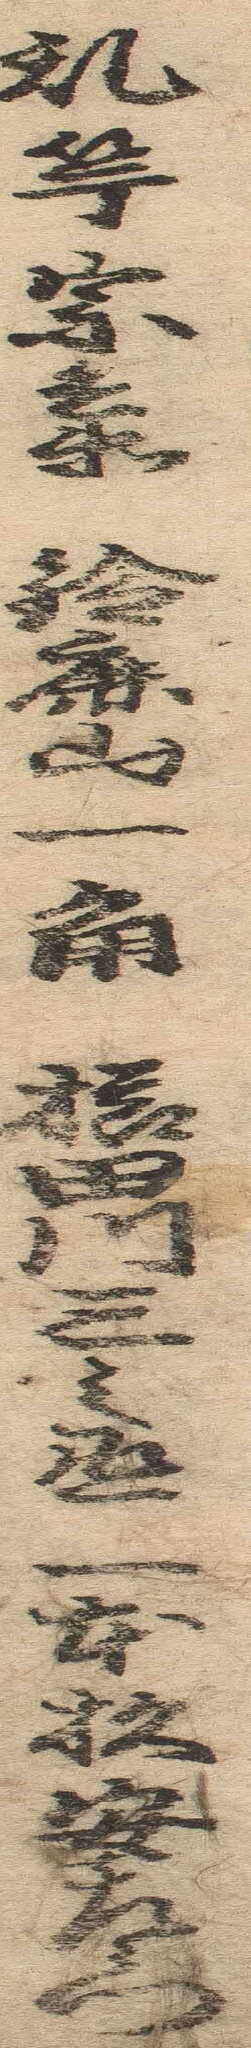乱竿宗兵衛鈴鹿山一角横田川三之丞一本杉安左衛門
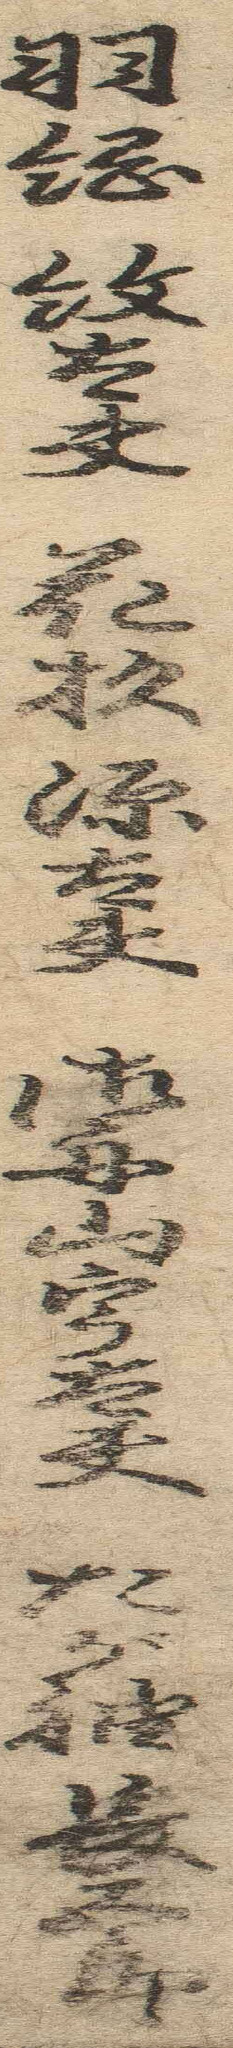羽綱紋太夫花杉源太夫御舟山宇太夫たが袖長五郎
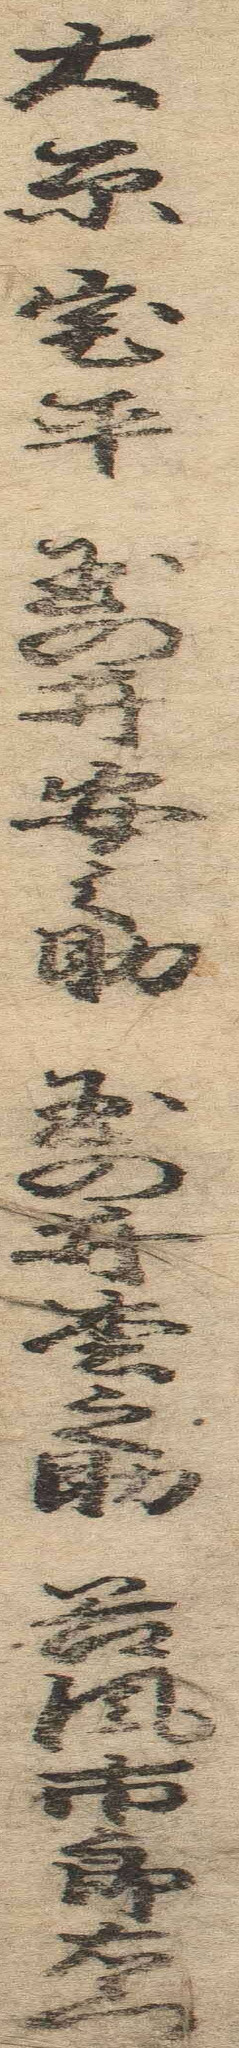大原宅平玉の井安之助玉の井松之助谷風市郎右衛門
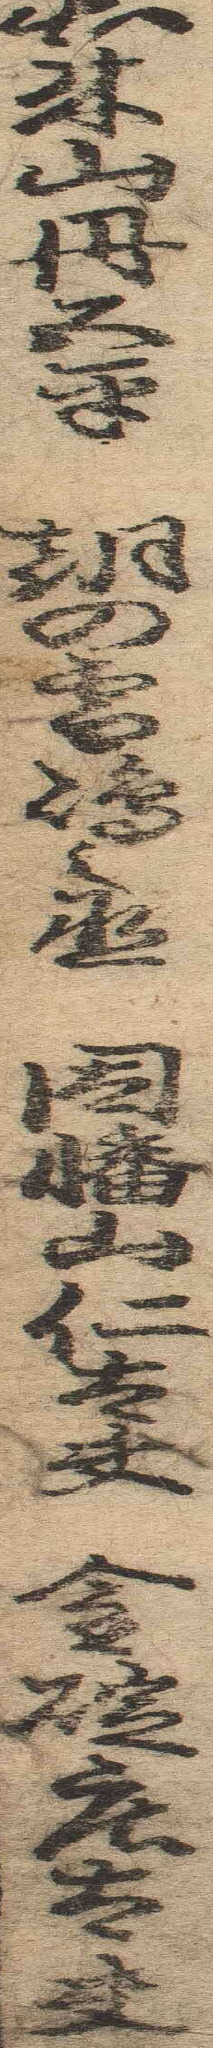出來山丹五平朝の雷嶋之丞因幡山仁太夫金碇庄太夫

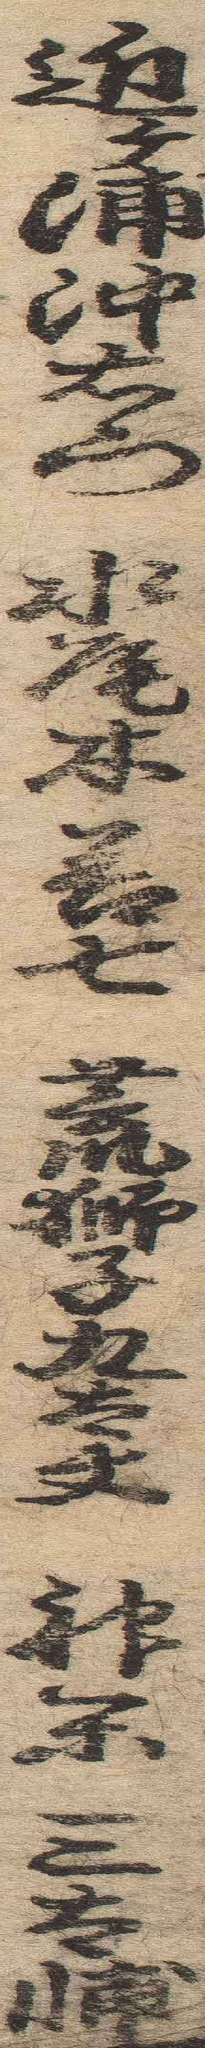近ケ浦沖右衛門水尾木善七荒獅子九太夫神楽三太輔
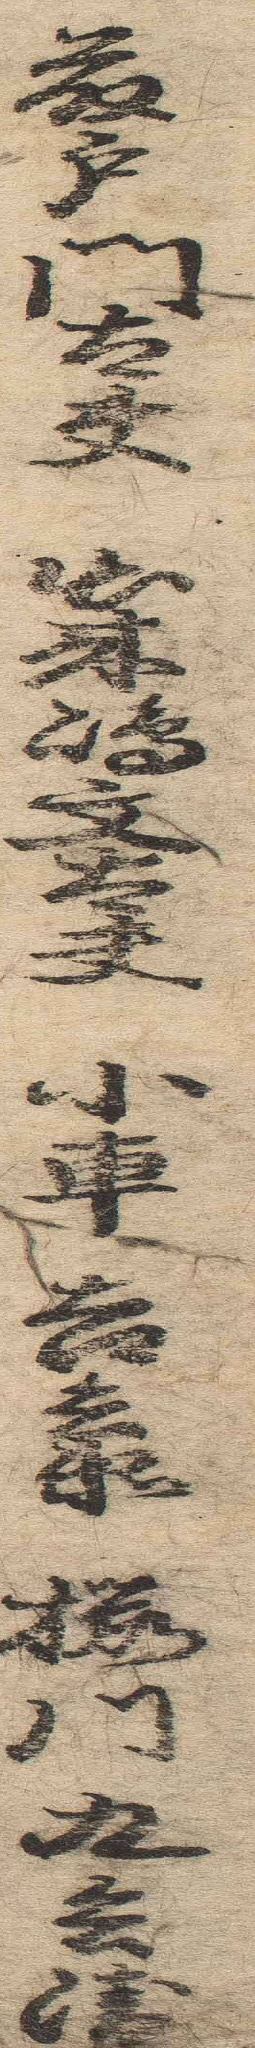前戸門太夫出来嶋文太夫小車吉兵衛桜川九兵衛
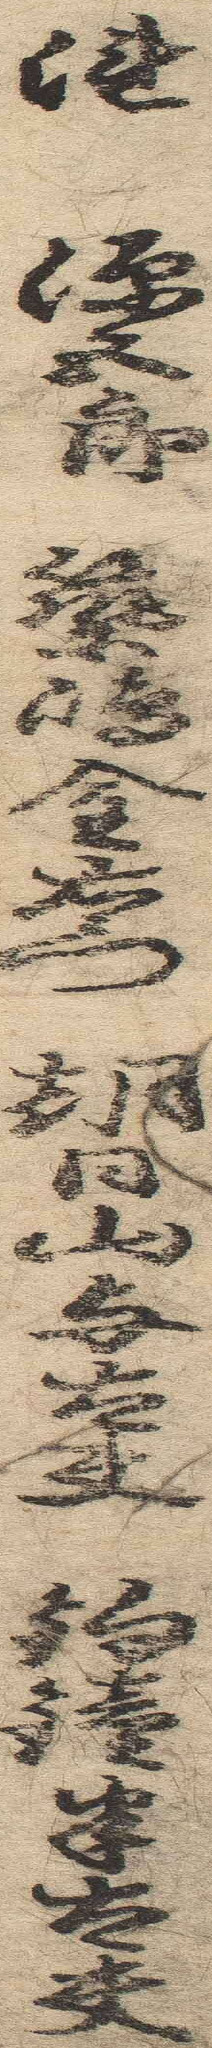漣源五郎築嶋金右衛門朝日山与太夫釣鐘半太夫
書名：古今相撲大全
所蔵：東京学芸大学附属図書館 国文学研究資料館
